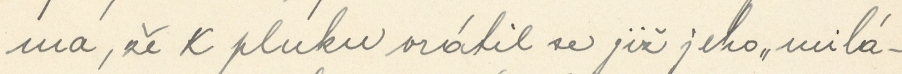má, že k pluku vrátil se již jeho „milá-
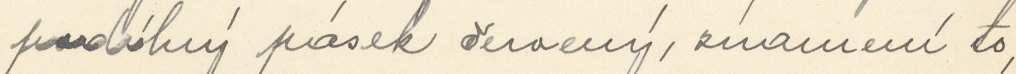podélný pásek červený, znamení to,
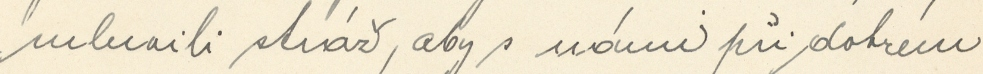mluvili stráž, aby s námi při dobrém
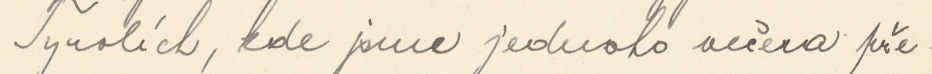Tyrolích, kde jsme jednoho večera pře-
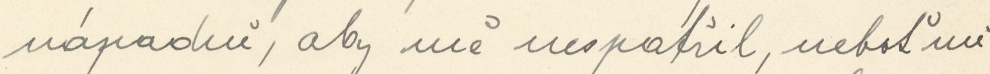nápadně, aby mě nespatřil, neboť mě
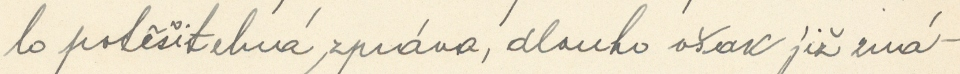lo potěšitelná zpráva, dlouho však již zná-
